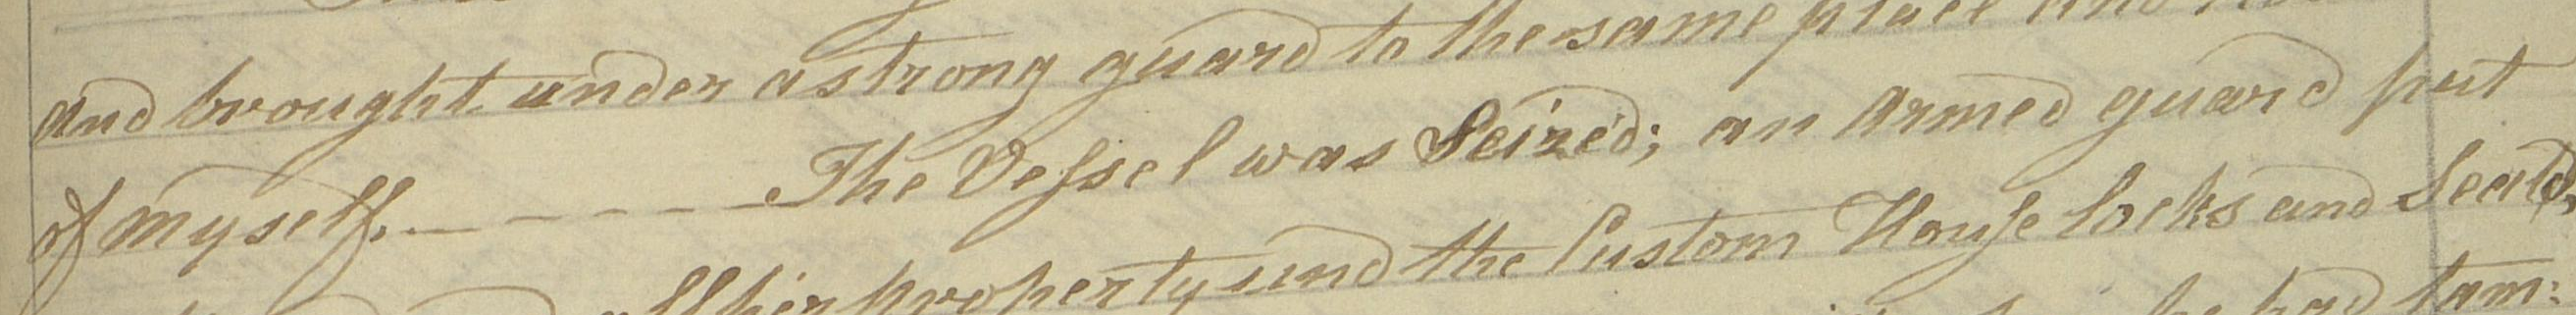of Myself. The Vessel was seized; an Armed guard put
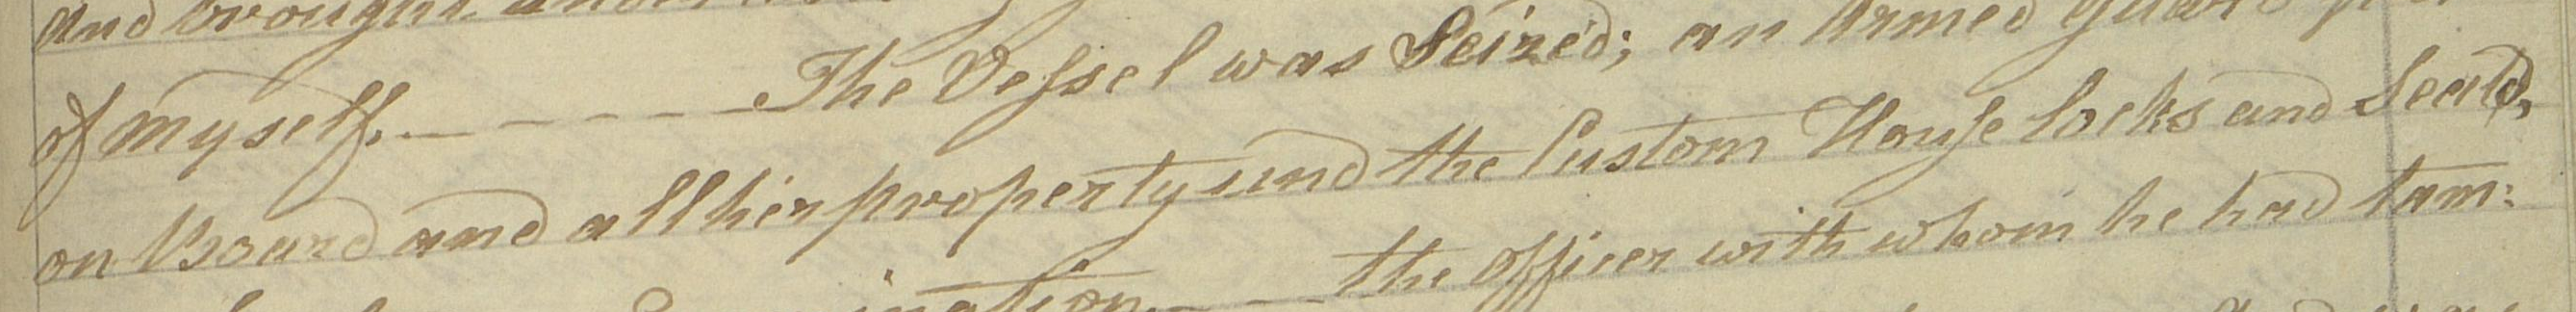on Board and all her property send the Custom House locks and Seald,
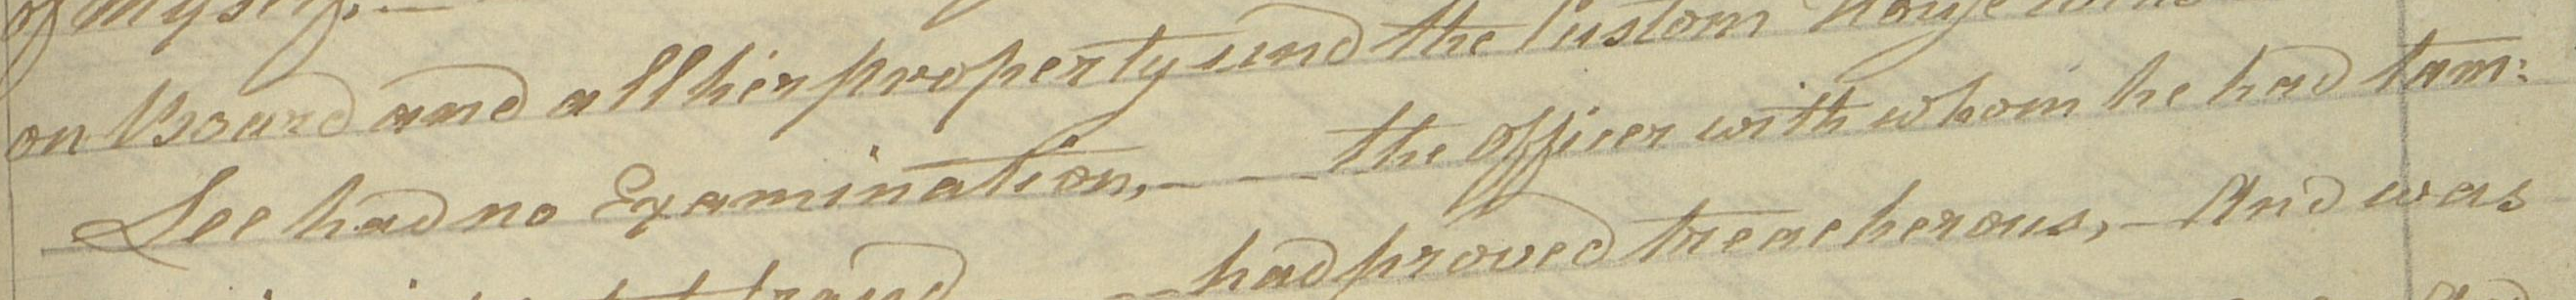Lee had no Examination, The Officer with whom he had tem-
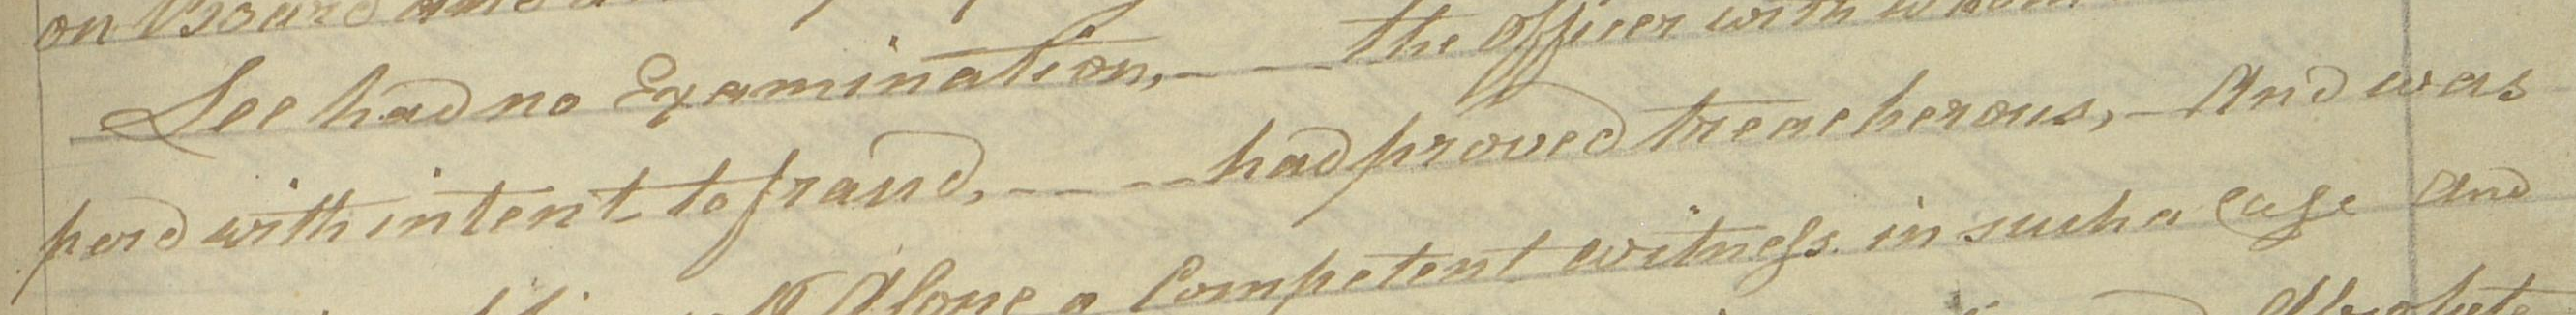-perd with intent to fraud, had proved treacherous, And was
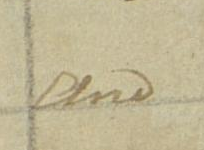And
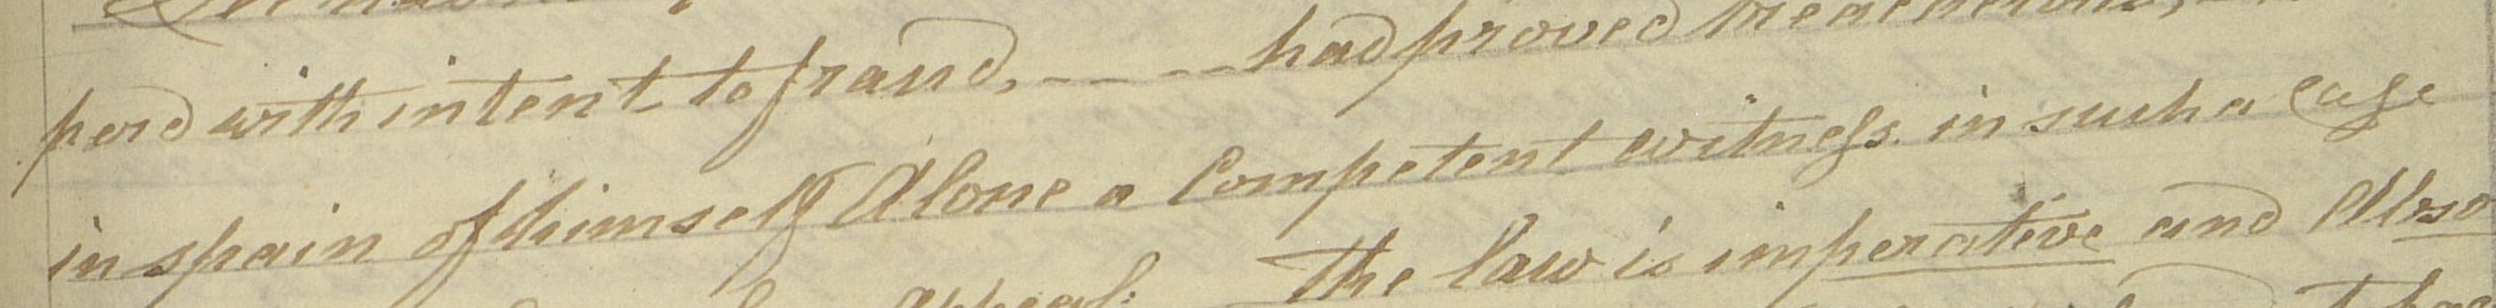in spain of himself Alone a Competent witness in such a Case And
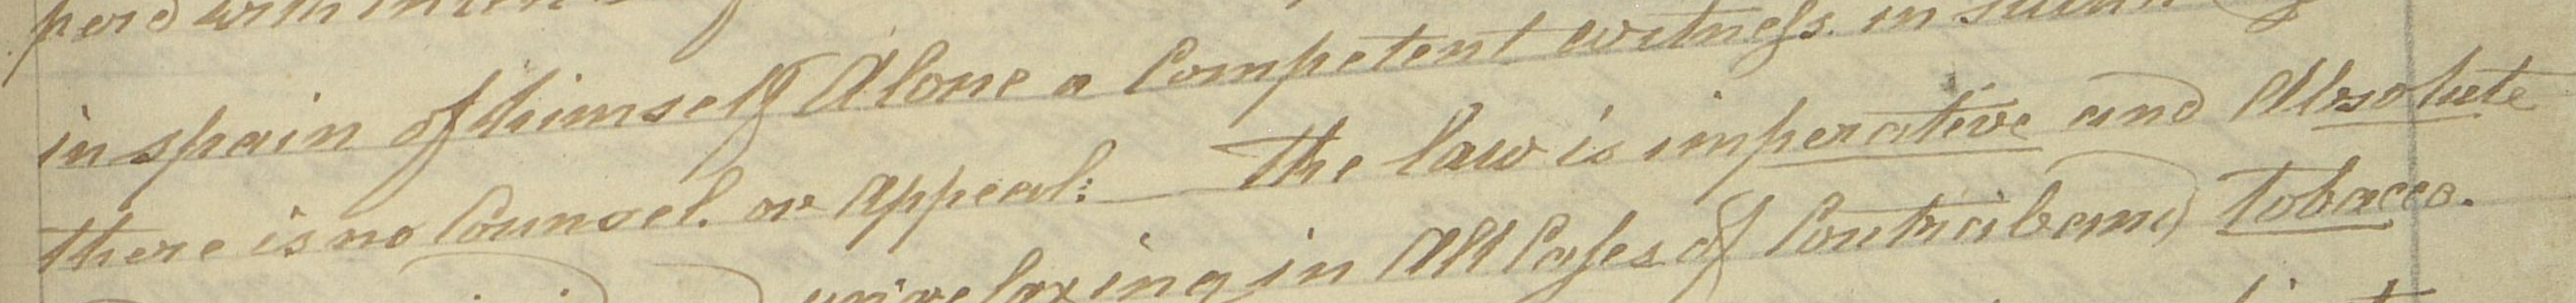there is no Counsel or Appeal: The law is imperative and Absolute
